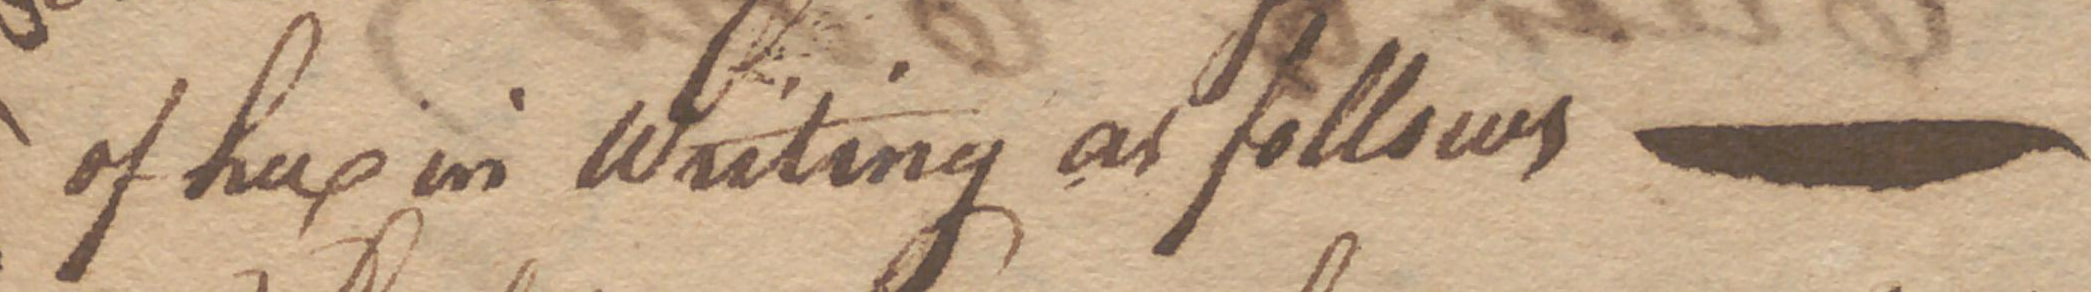of has in writing at follows-
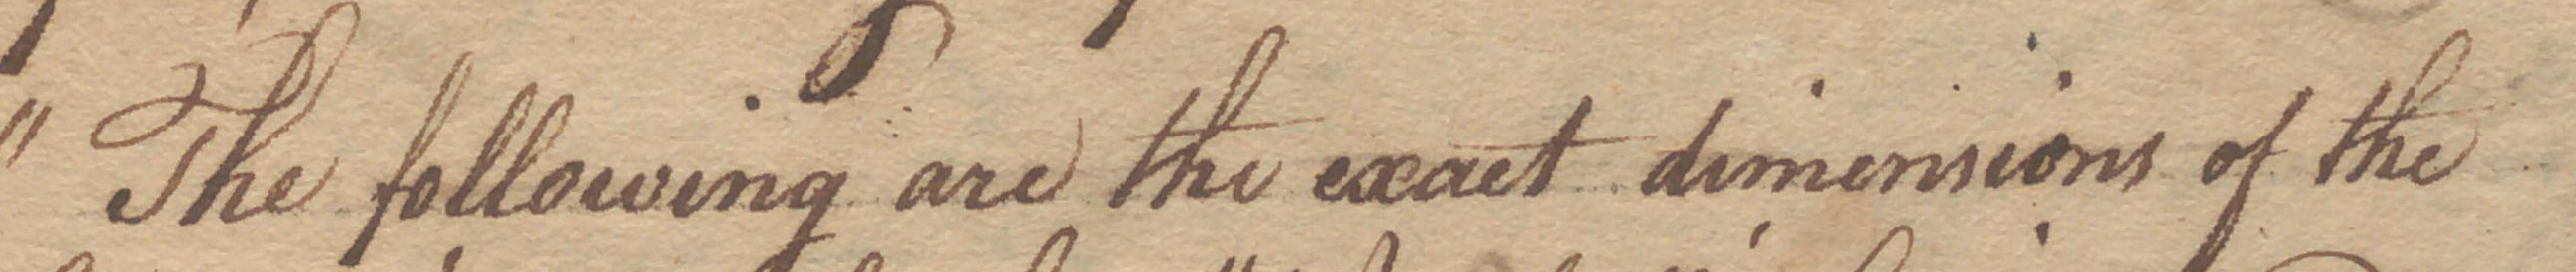The following are the exact dimensions of the
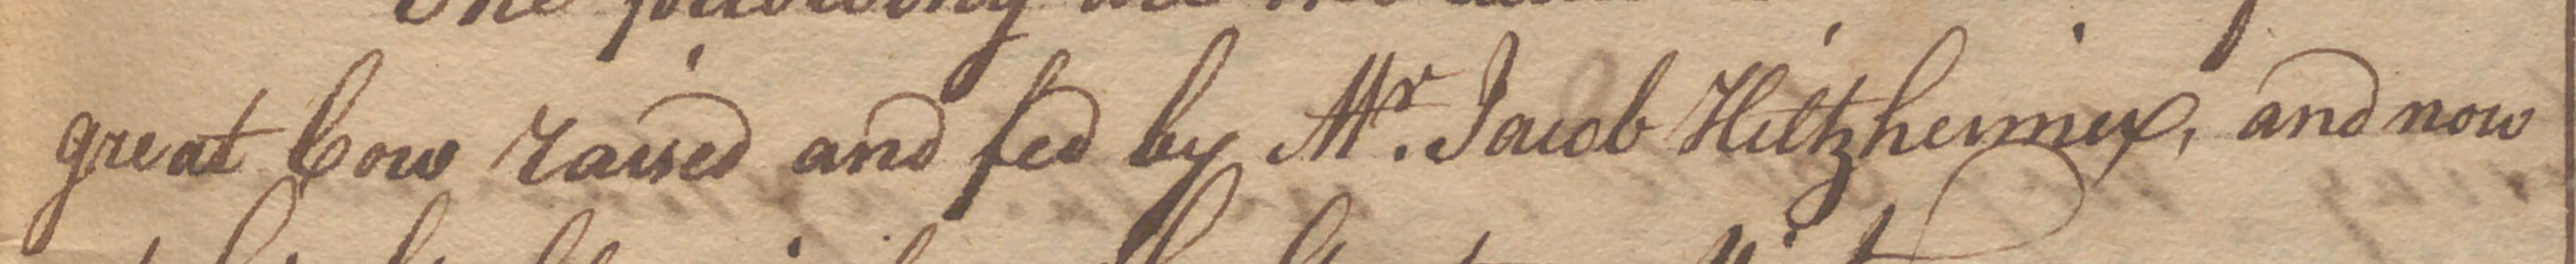great Cow raised and fed by M^r. Jacob Hiltzheimer, and now
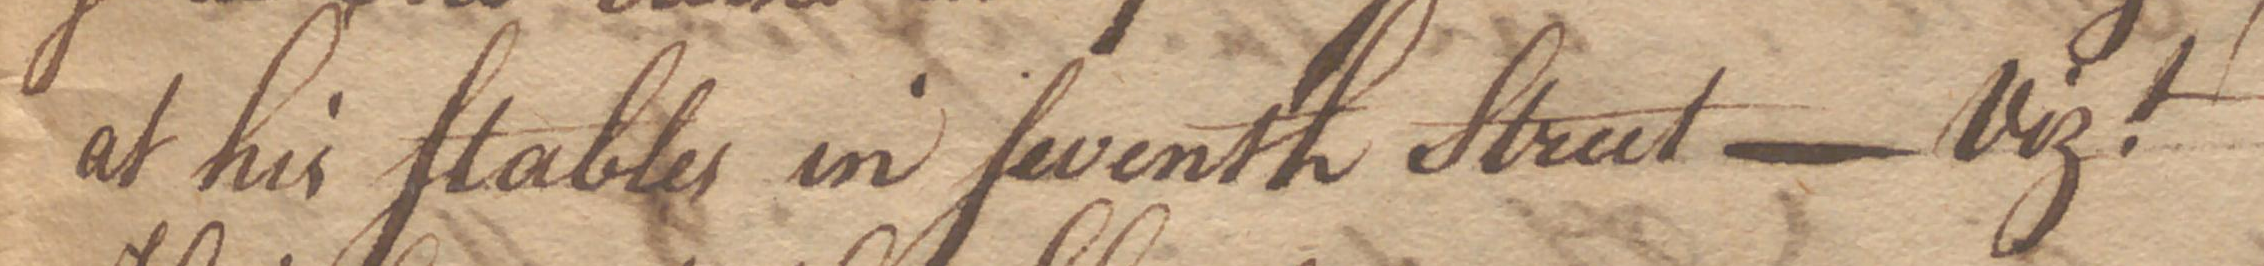at his stables in seventh Street- Viz^t.
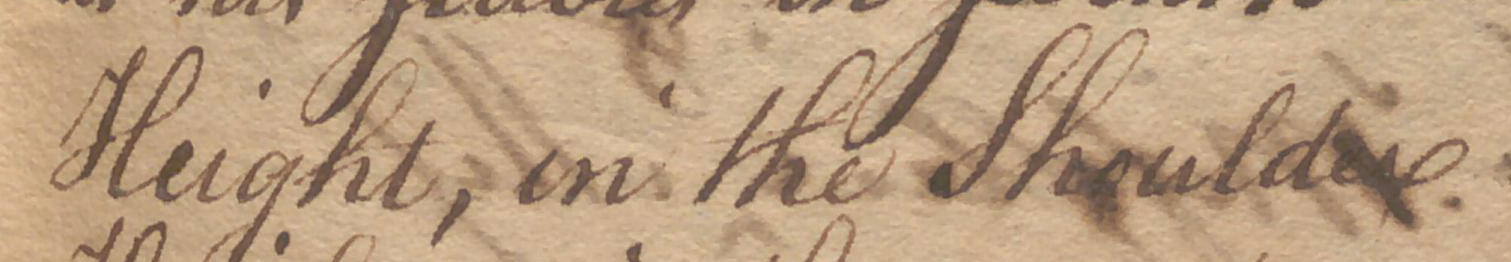Height, in the Shoulder
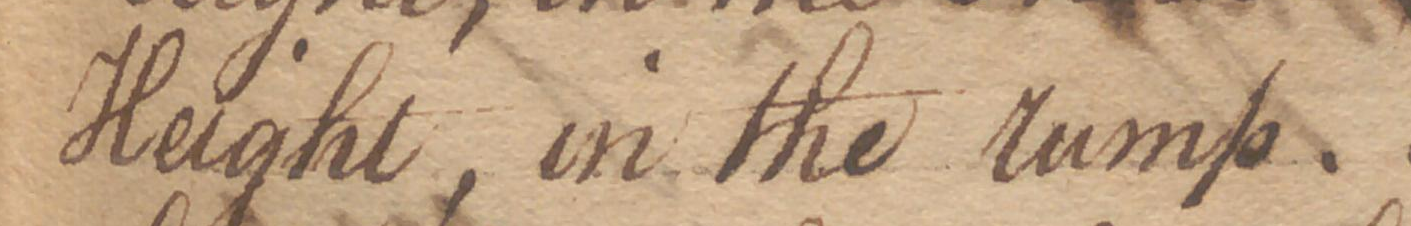Height, in the rump.
